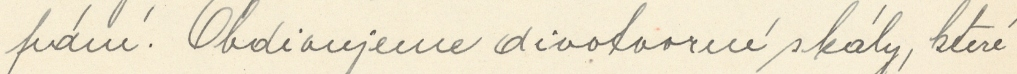pání. Obdivujeme divotvorné skály, které
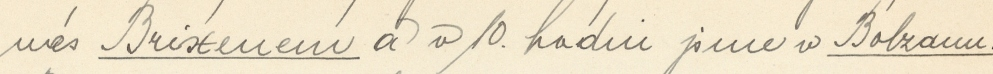nás Bristenem a v 10 hodin jsme v Bolzanu.
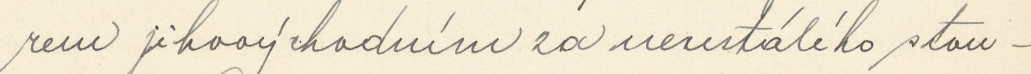rem jihovýchodním za neustálého stou-
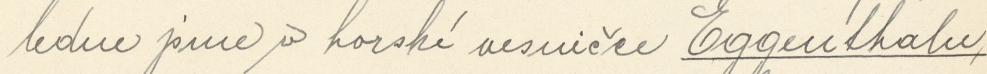ledne jsme v horské vesničce Eggenthalu,
